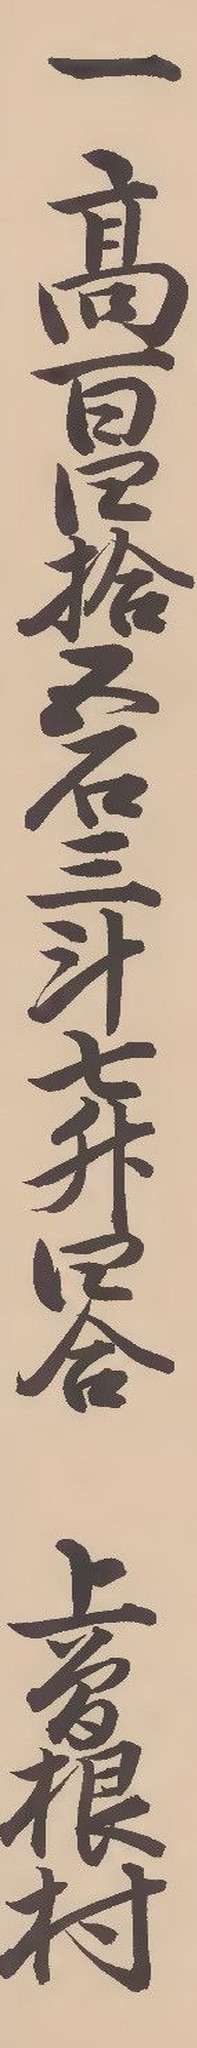一高百四拾五石三斗七升四合上曽根村
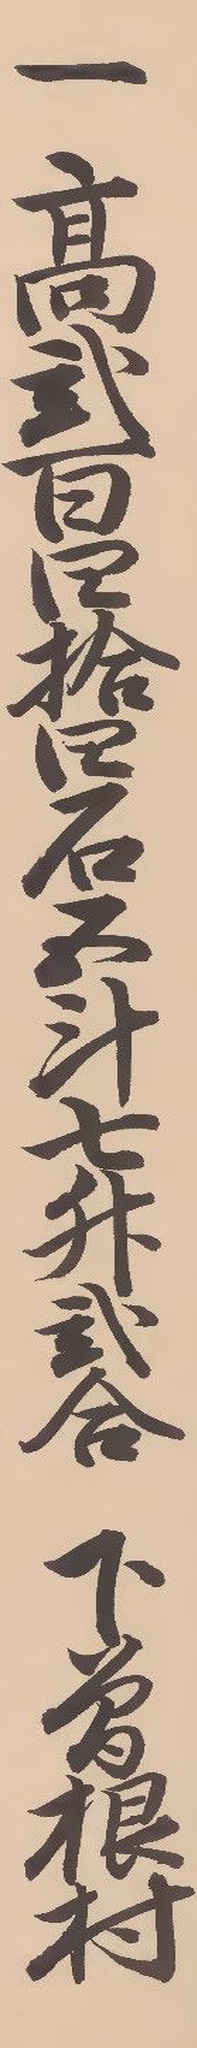一高弐百四拾四石五斗七升弐合下曽根村
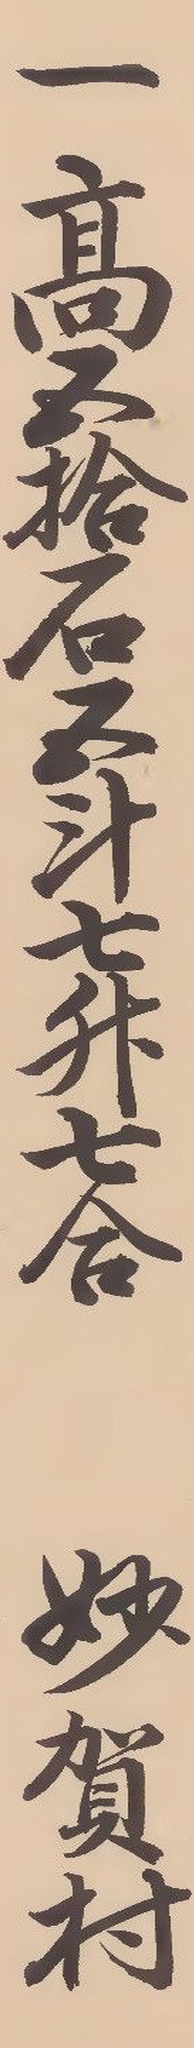一高五拾石五斗七升七合妙賀村
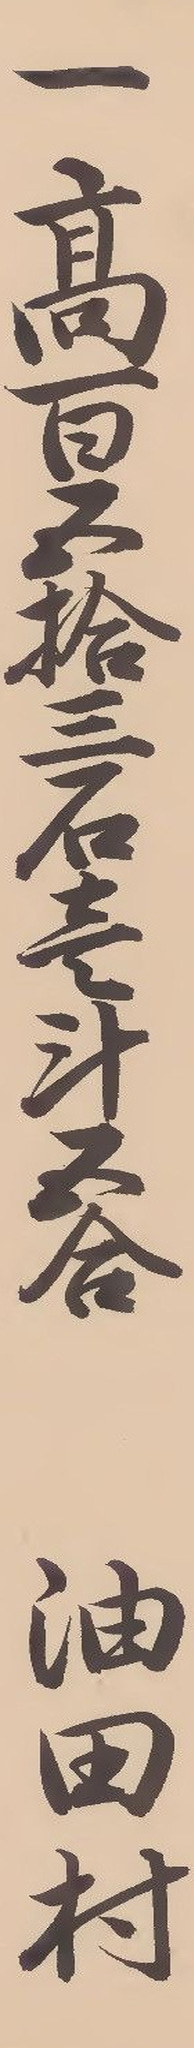一高百五拾三石壱斗五合油田村
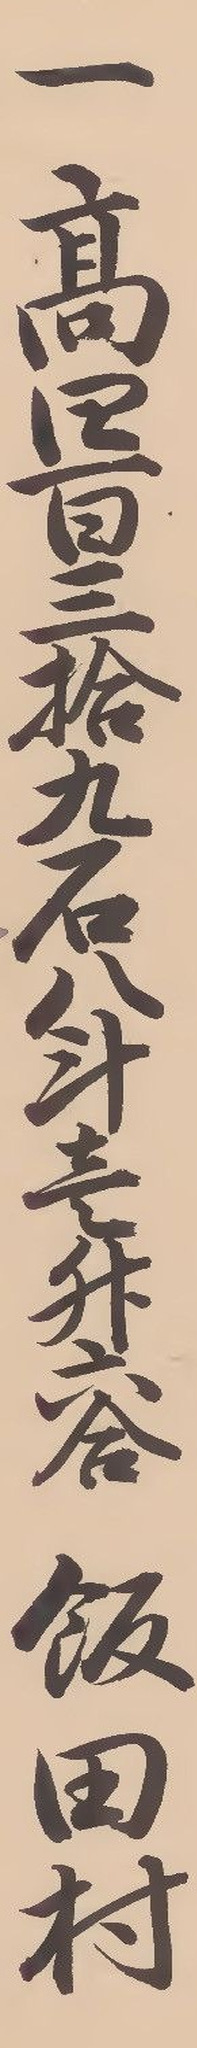一高四百三拾九石八斗壱升六合飯田村

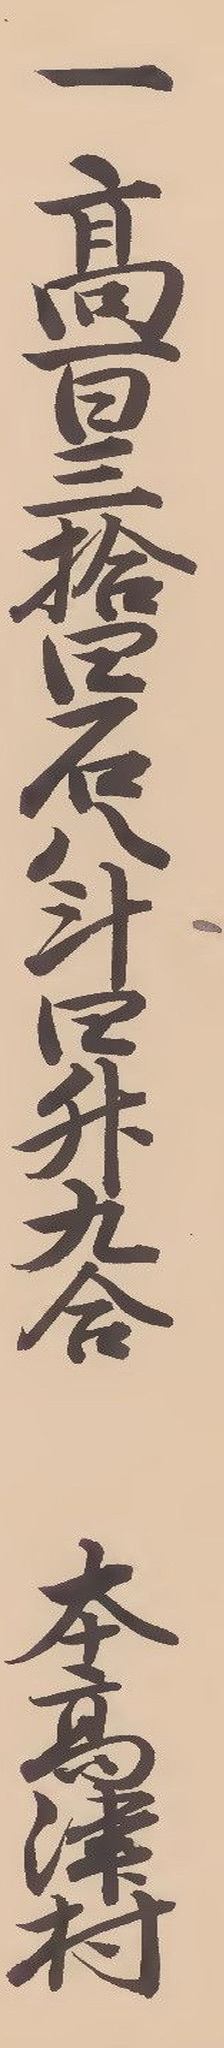一高百三拾四石八斗四升九合本高津村
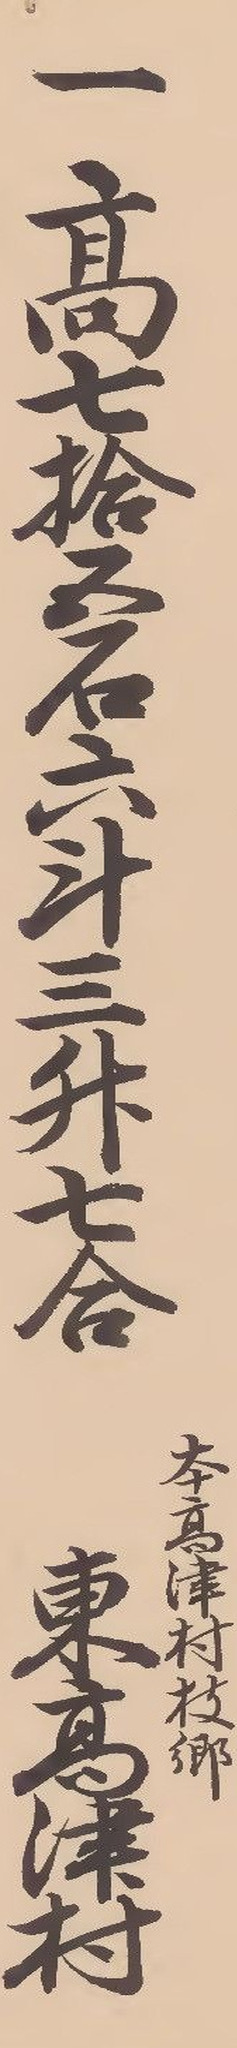一高七拾五石六斗三升七合東高津村
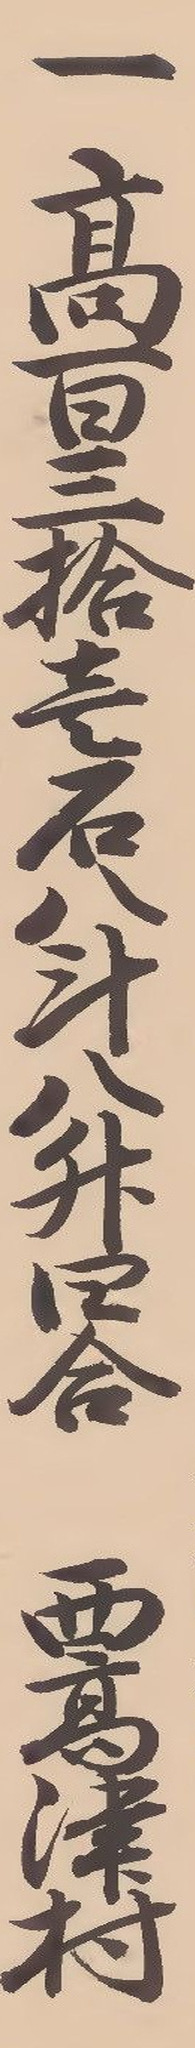一高百三拾壱石八斗八升四合西高津村
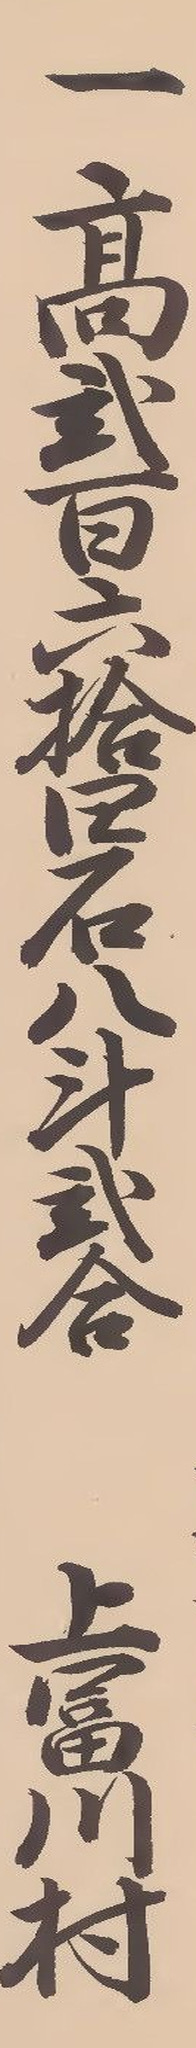一高弐百六拾四石八斗弐合上富川村
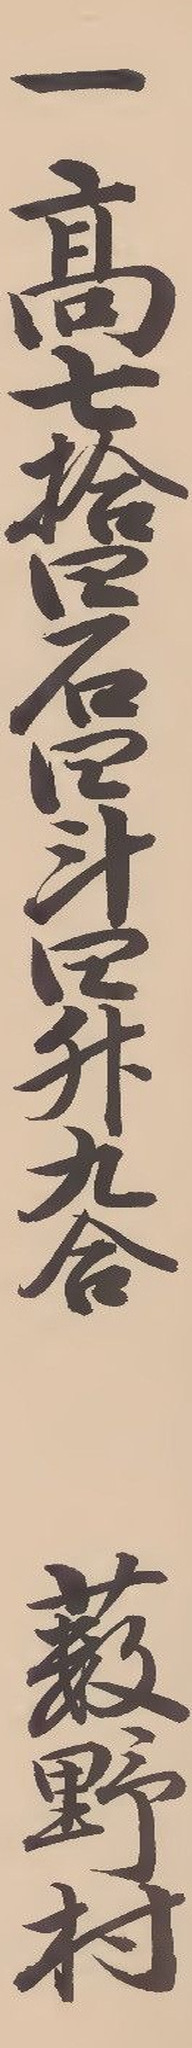一高七拾四石四斗四升九合薮野村
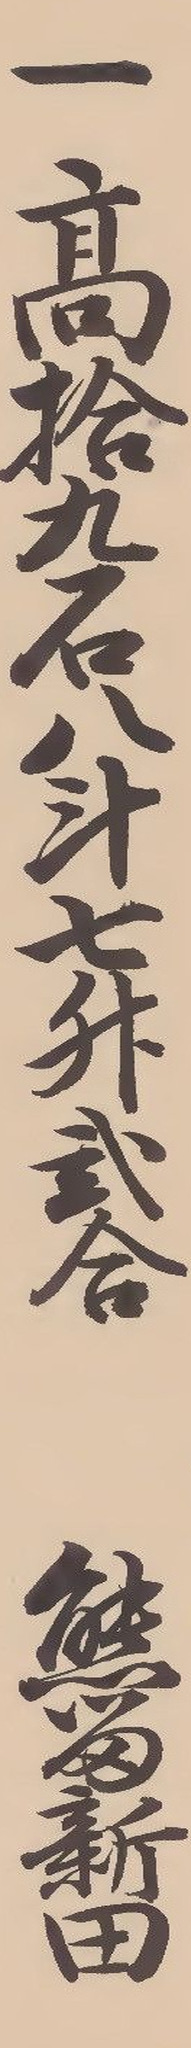一高拾九石八斗七升弐合熊留新田
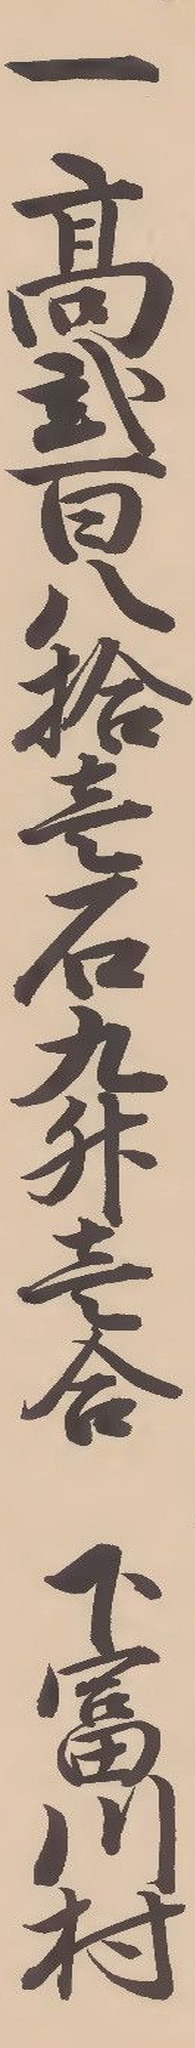一高弐百八拾壱石九升壱合下富川村
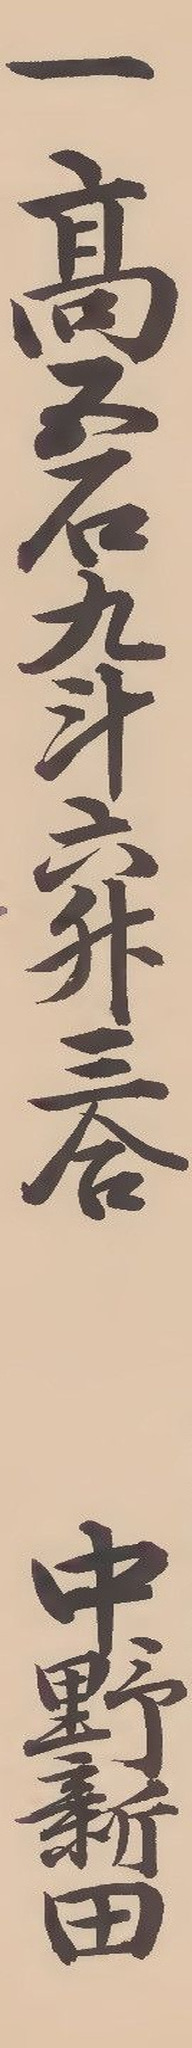一高五石九斗六升三合中野新田

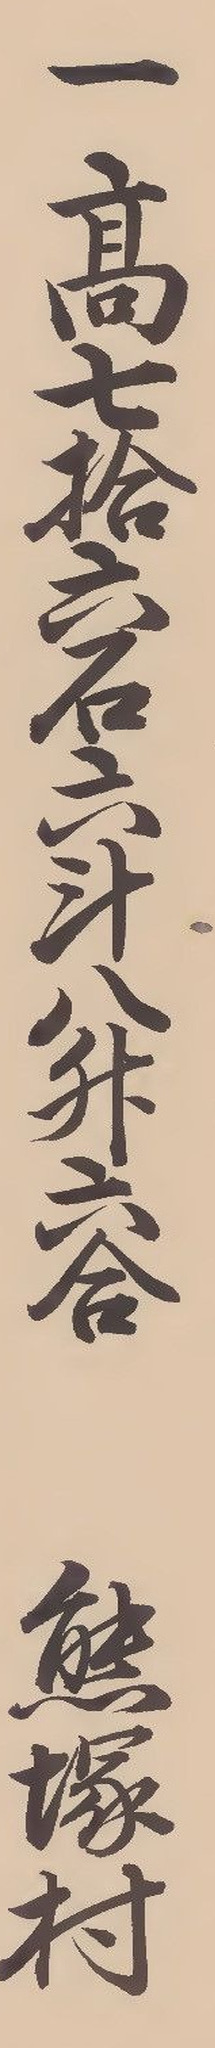一高七拾六石六斗八升六合熊塚村
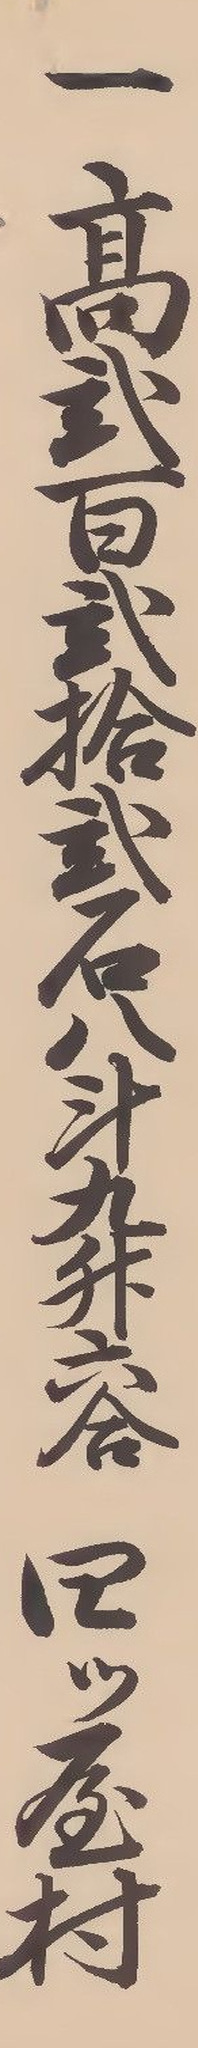一高弐百弐拾弐石八斗九升六合四ツ屋村
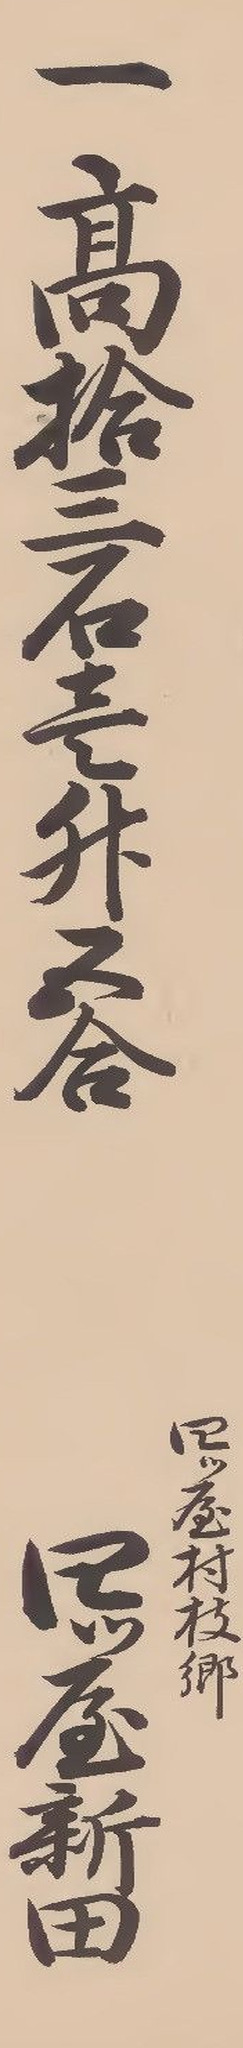一高拾三石壱升五合四ツ屋新田
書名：越後国郷帳　上
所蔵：国立公文書館 National Archives of Japan
